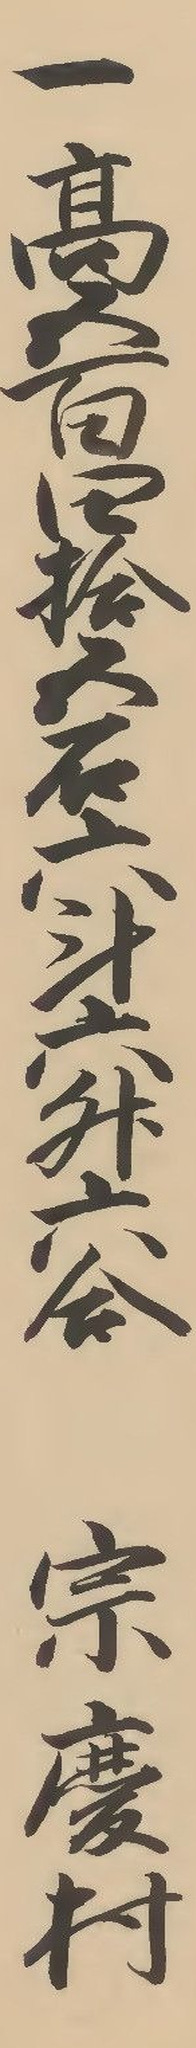一高五百四拾五石六斗六升六合宗慶村

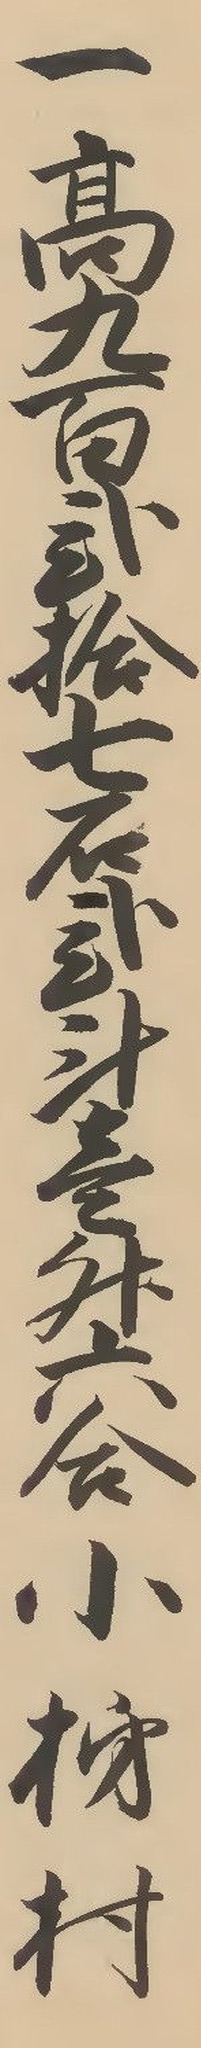一高九百弐拾七石弐斗壱升六合小柿村
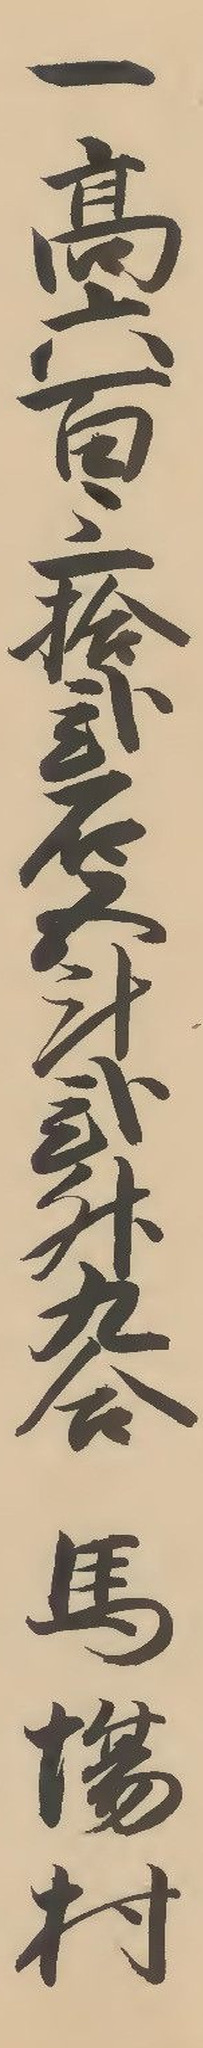一高六百三拾弐石五斗弐升九合馬場村
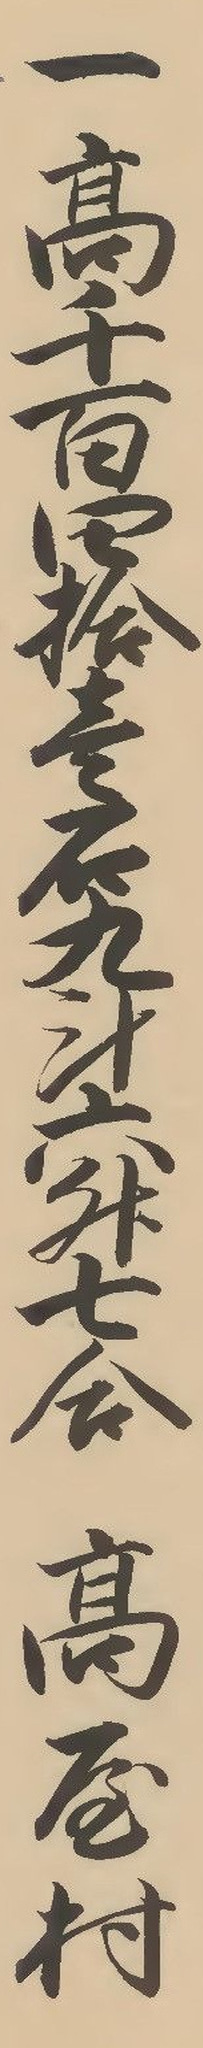一高千百四拾壱石九斗六升七合高屋村
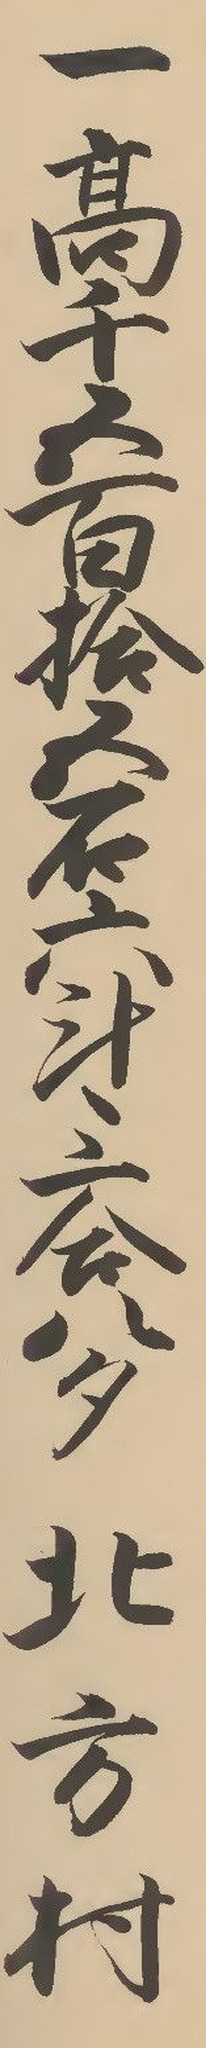一高千五百拾五石六斗三合八勺北方村
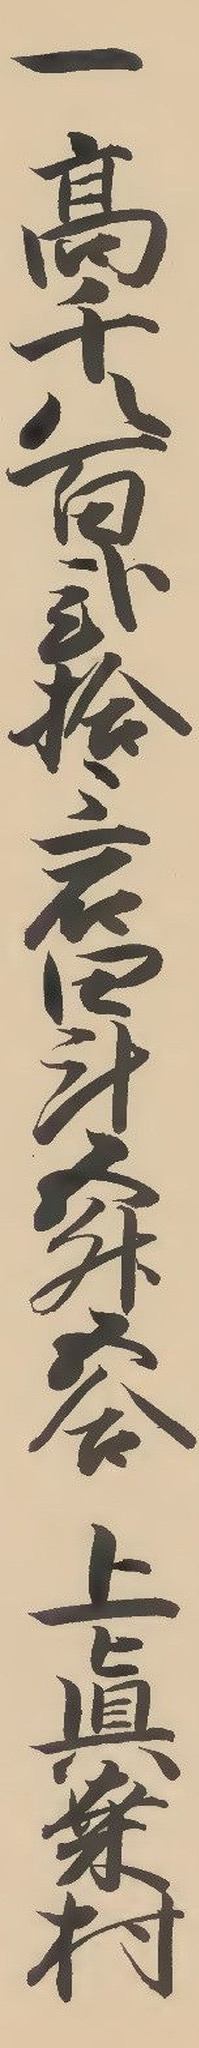一高千八百弐拾三石四斗五升五合上真桑村
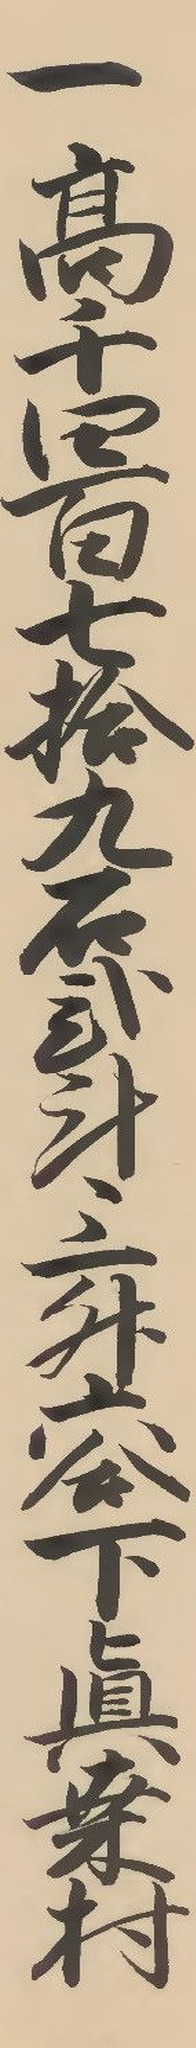一高千四百七拾九石弐斗三升六合下真桑村
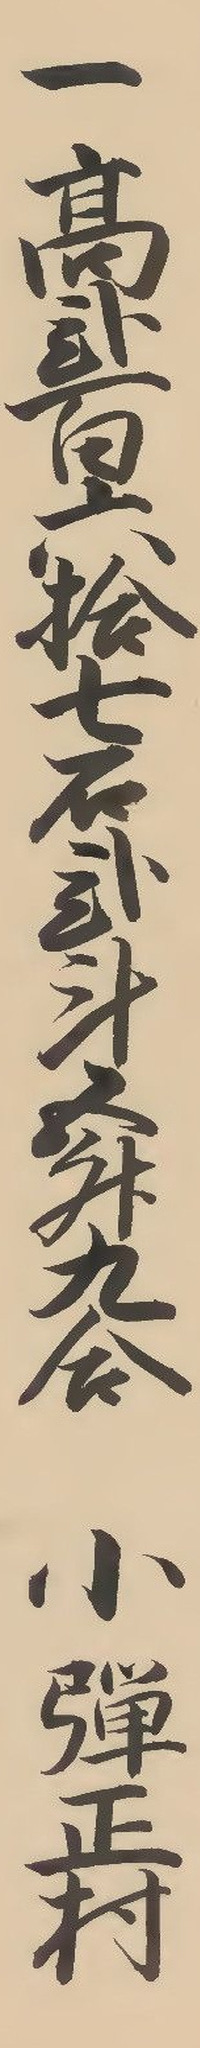一高弐百六拾七石弐斗五升九合小弾正村

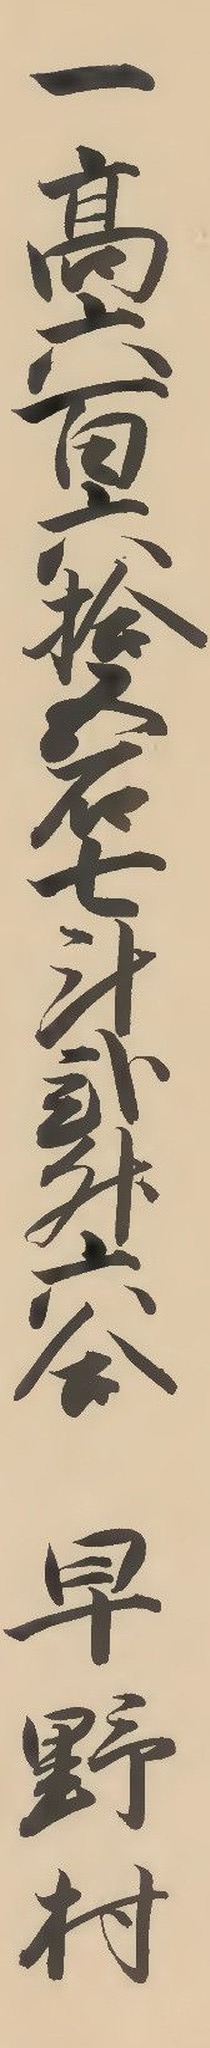一高六百六拾五石七斗弐升六合早野村
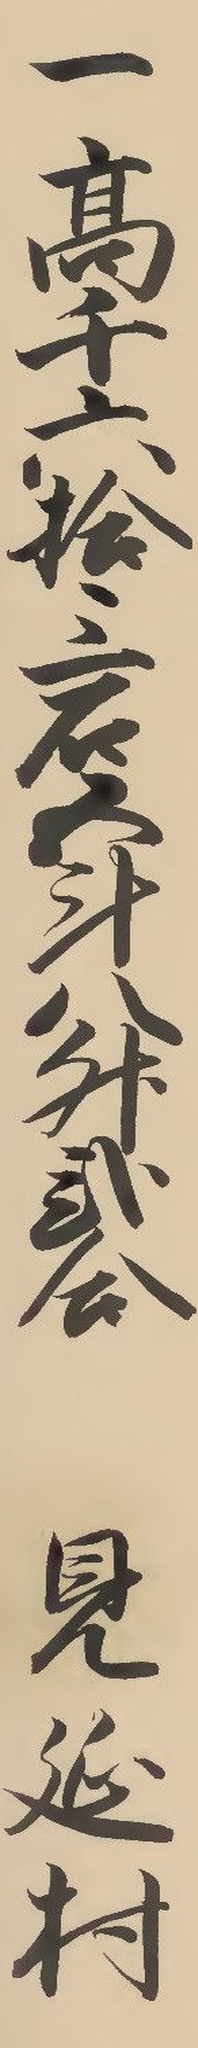一高千六拾三石五斗八升弐合見延村
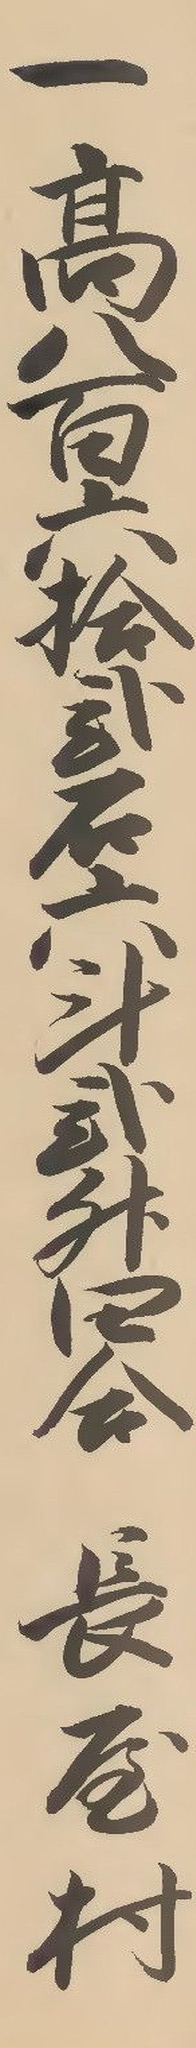一高八百六拾弐石六斗弐升四合長屋村
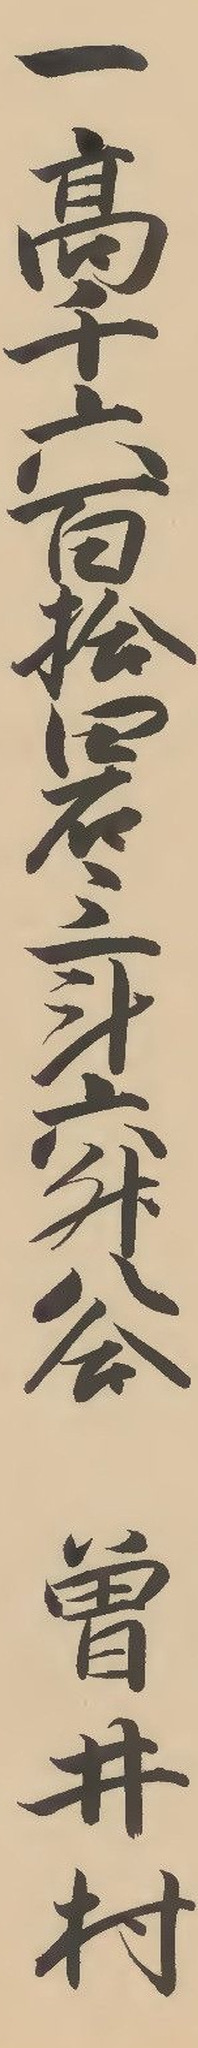一高千六百拾四石三斗六升八合曽井村
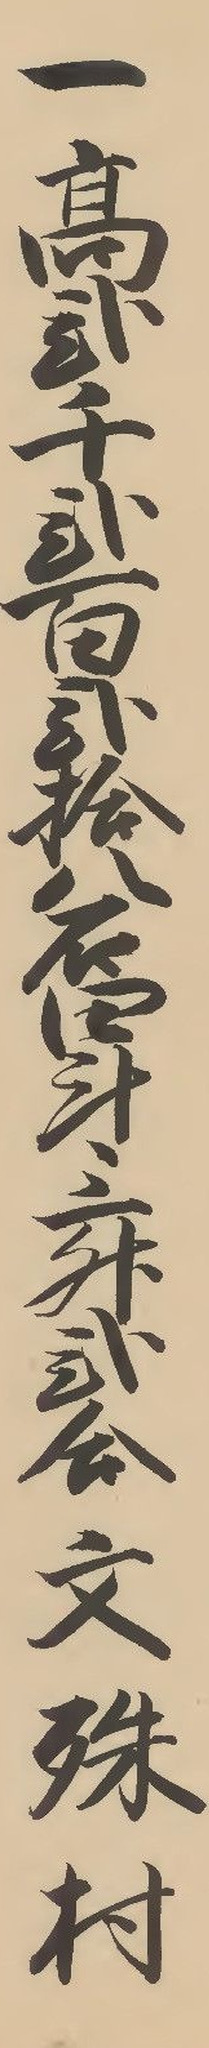一高弐千弐百弐拾八石四斗三升弐合文殊村
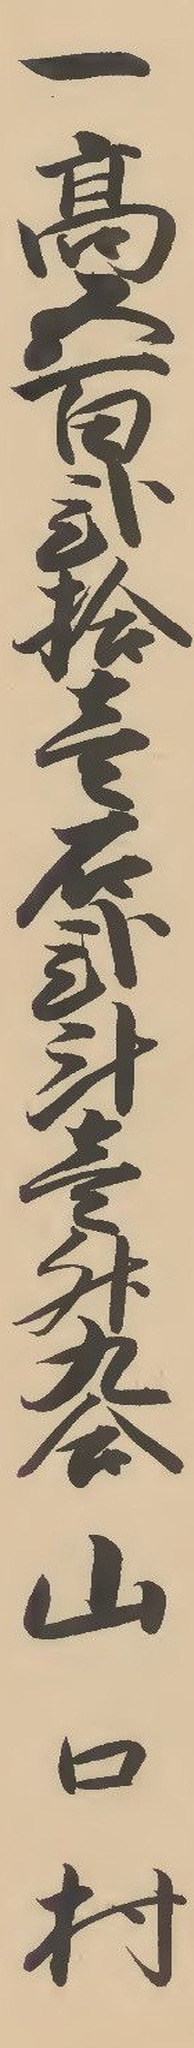一高五百弐拾壱石弐斗壱升九合山口村

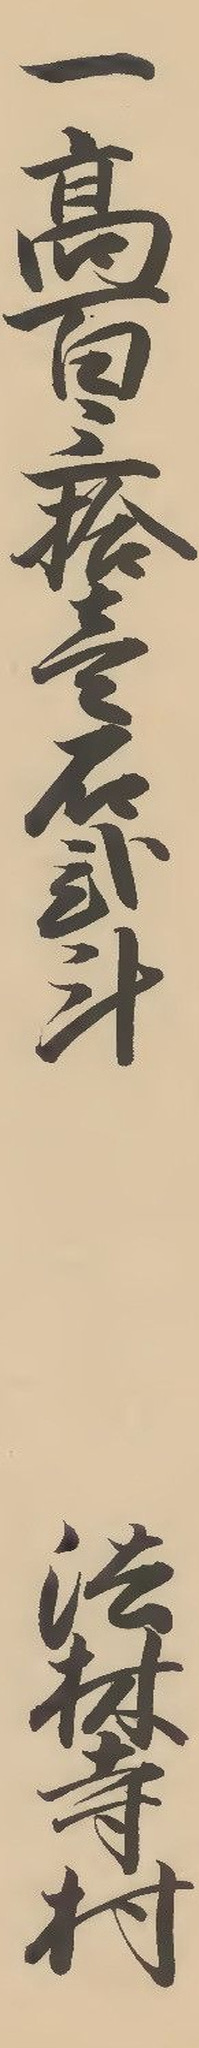一高百三拾壱石弐斗法林寺村
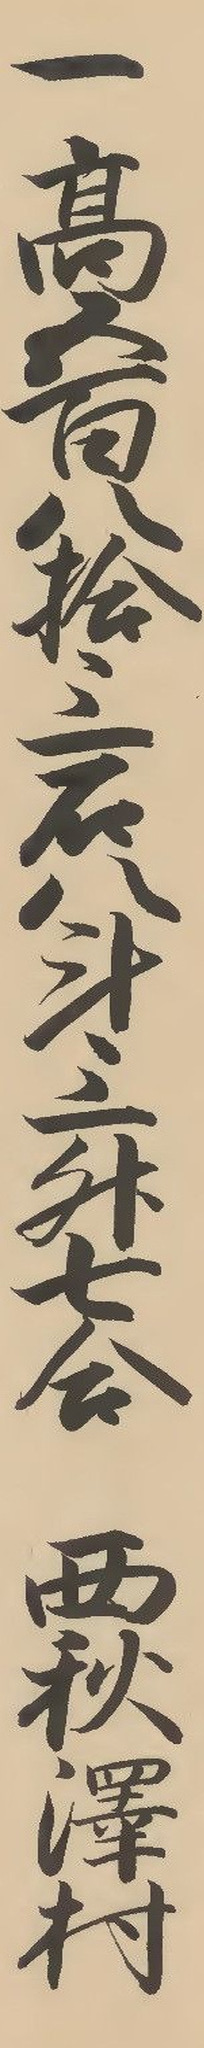一高五百八拾三石八斗三升七合西秋沢村
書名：美濃国郷帳
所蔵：国立公文書館 National Archives of Japan
